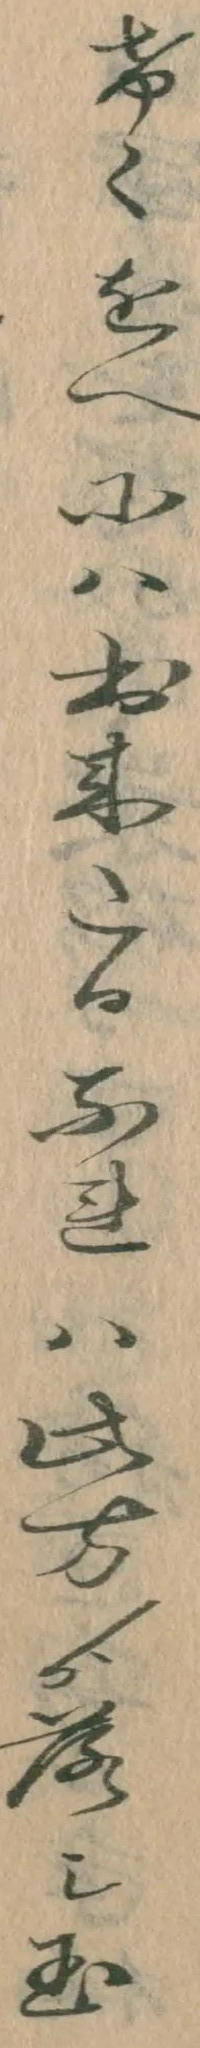希くをへ尓は出来たるな連は此方ゟ落し至
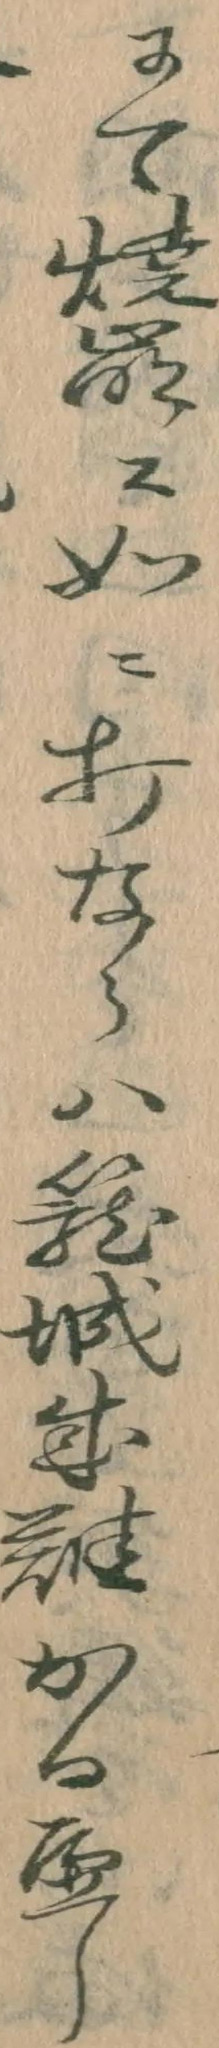尓て焼崩す如に打ならは籠城成難かる扁し
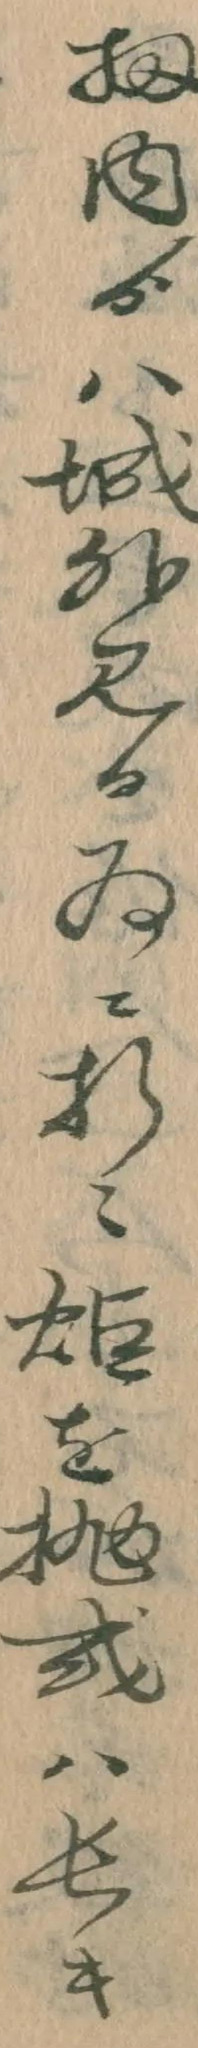扨内ゟは城外見るゐに折々炬を抛或は長き
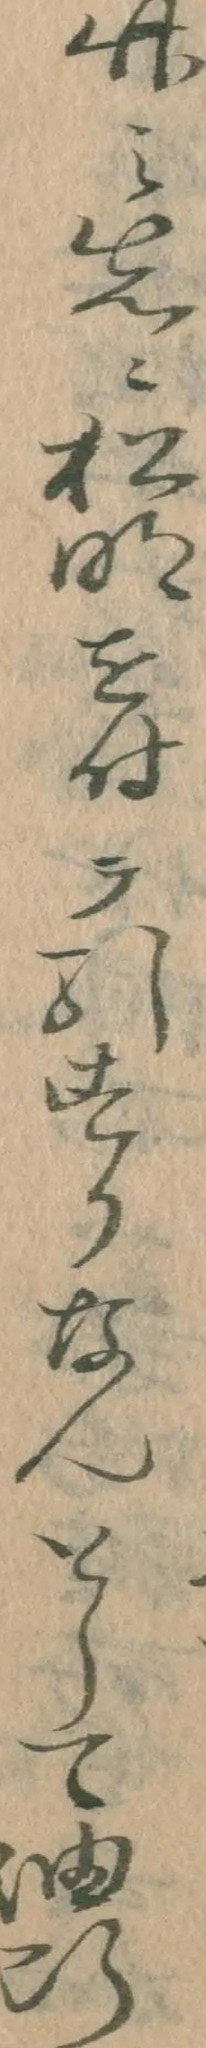竹之先に松明を付て引春りなんとして油断
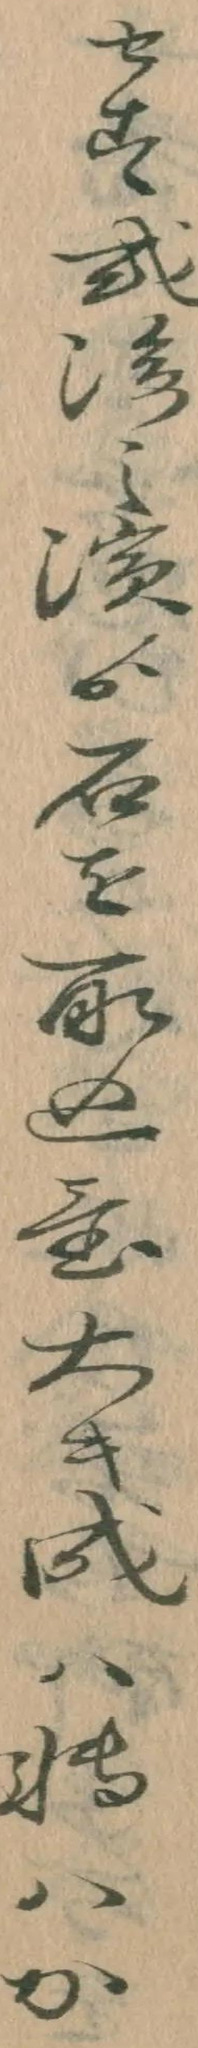せ春或後之浜ゟ石を取込置大き成は転はか
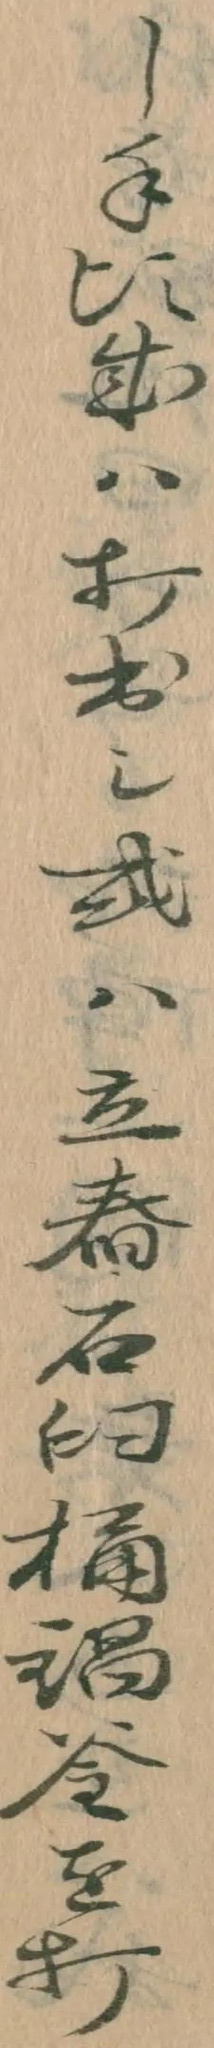し手頃成は打出し或は立舂石臼桶鍋釜を打
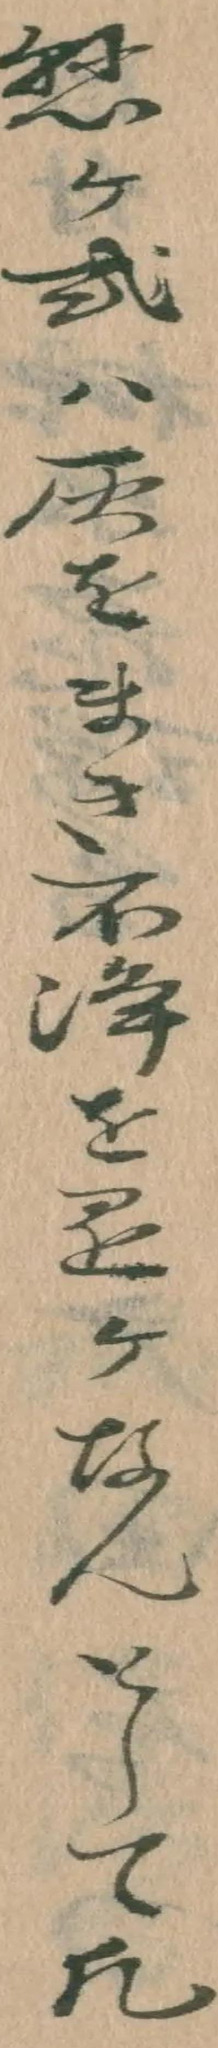懸け或は灰をまき不浄を懸けなんとして凡
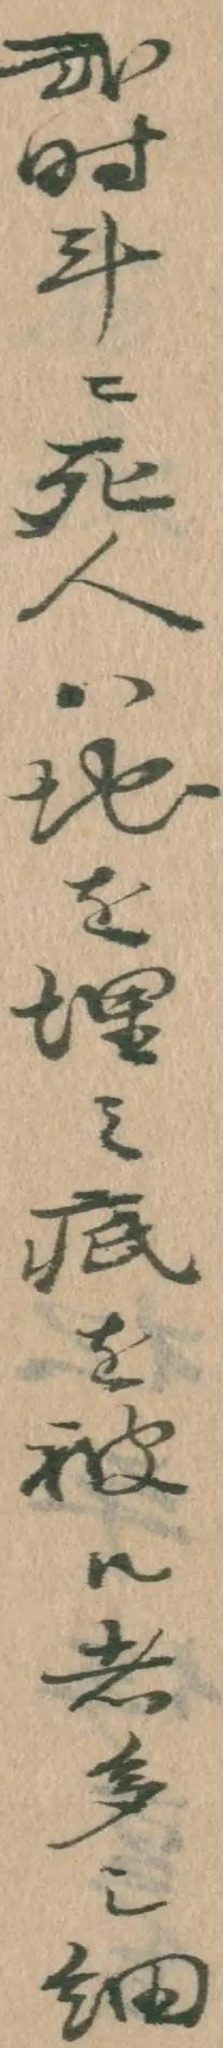弐時斗に死人は地を埋み疵を被る者多し細
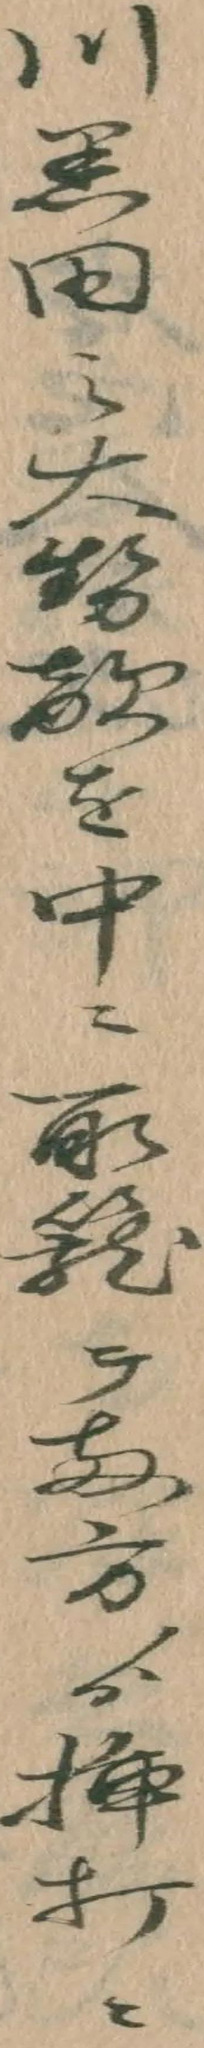川黒田之大勢敵を中に取籠て両方ゟ捜打に
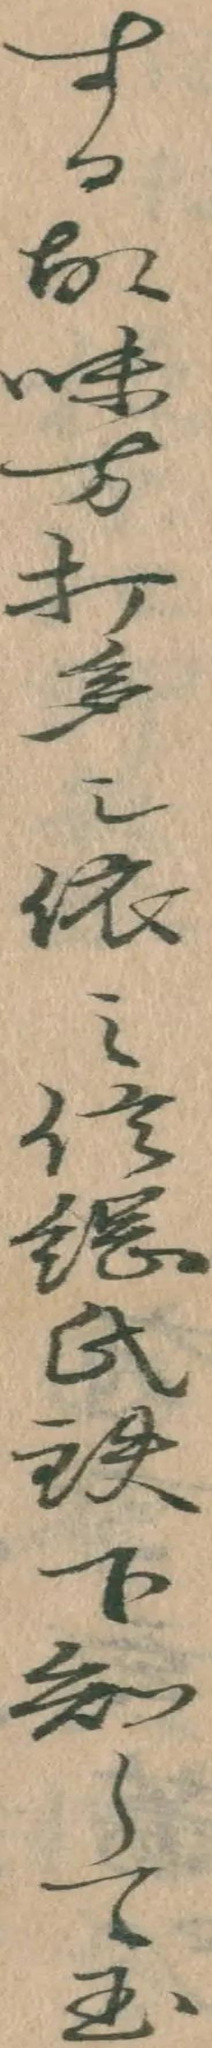する故味方打多し依之信綱氏鉄下知して至
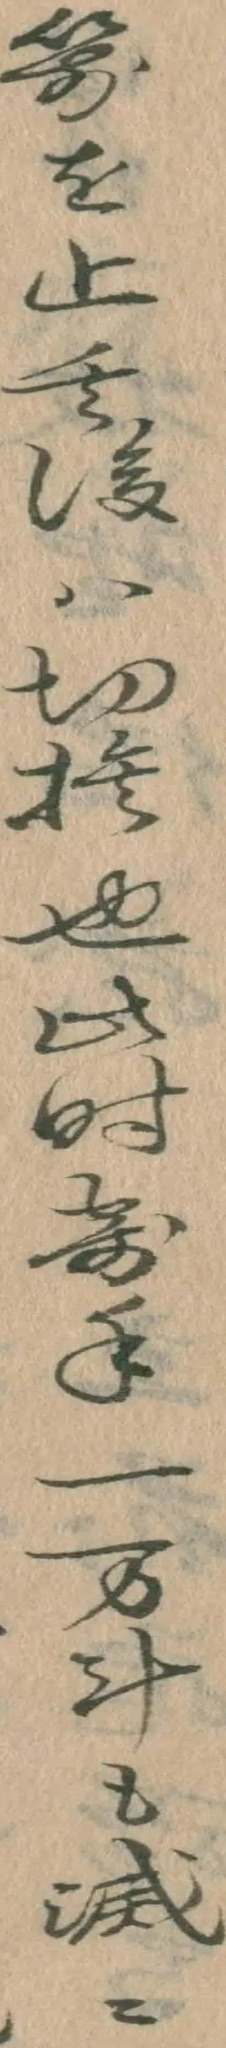箭を止其後は切捨也此時寄手一万斗も減に
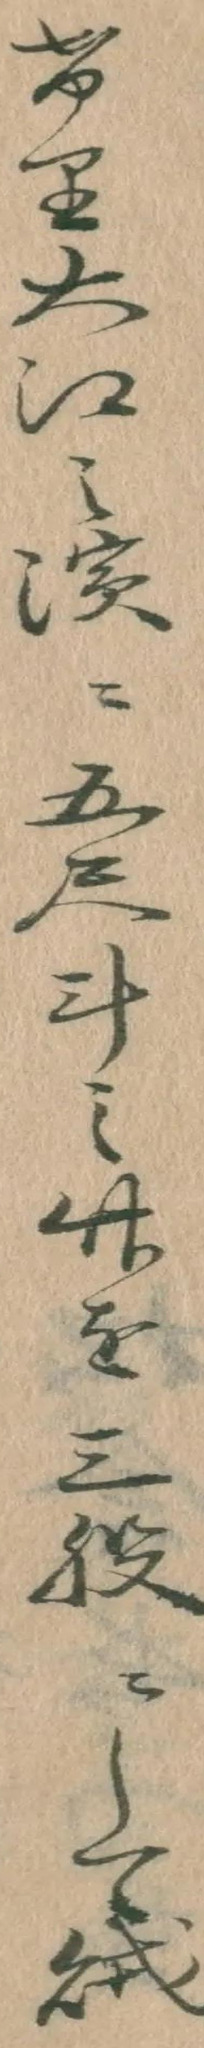希里大江之浜に五尺斗之竹を三股にして賊
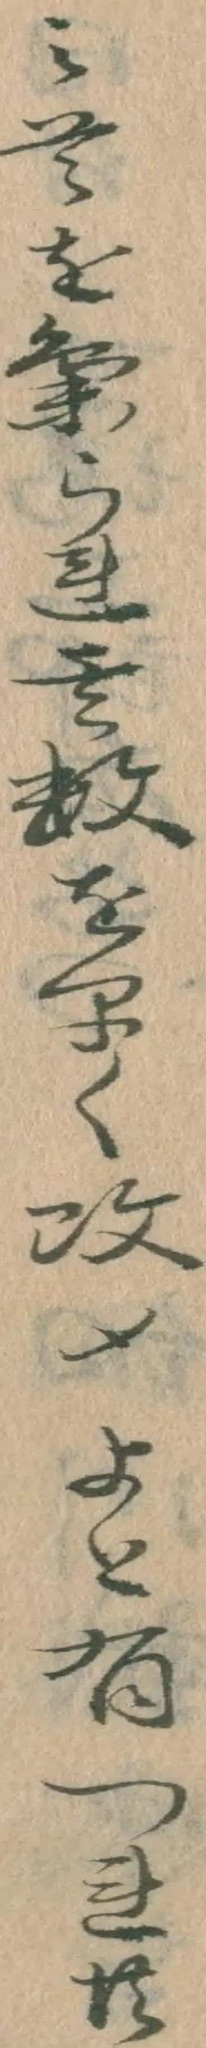之首を気ら連其数を早く改めよと有つ連共
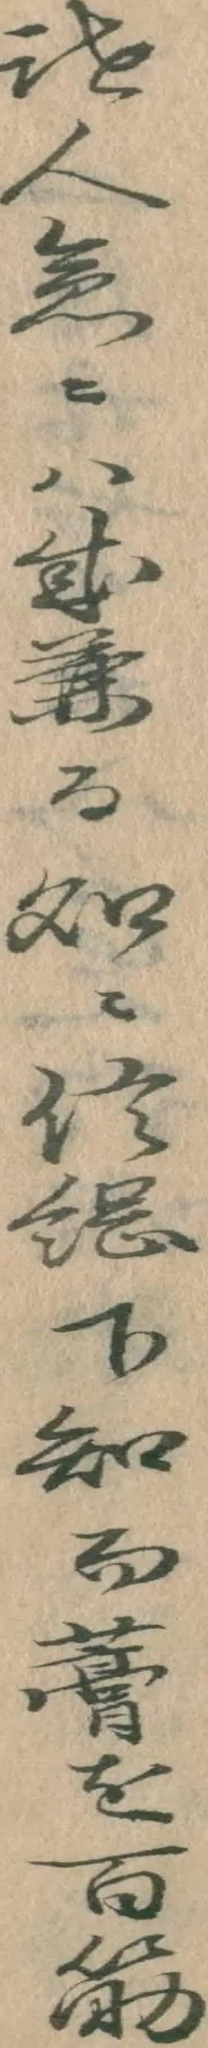諸人急には成兼る処に信綱下知而藁を百筋
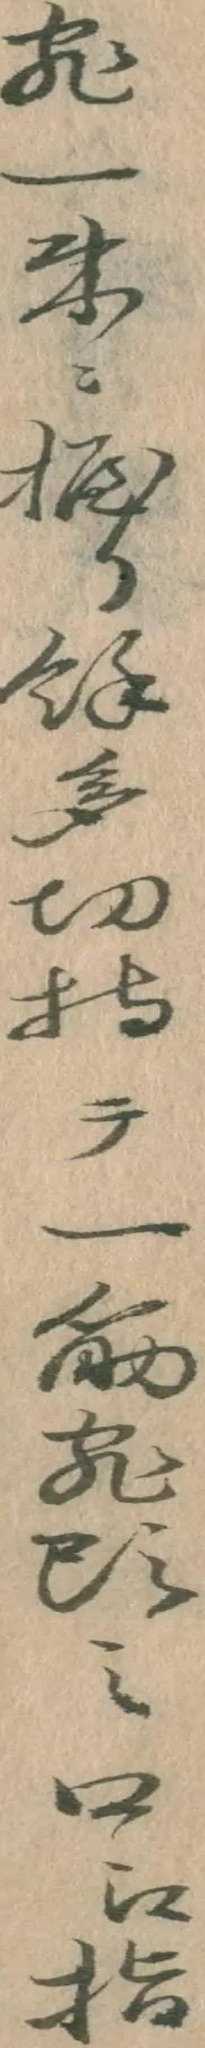究一束に握り余多切持て一筋究頭之口江指
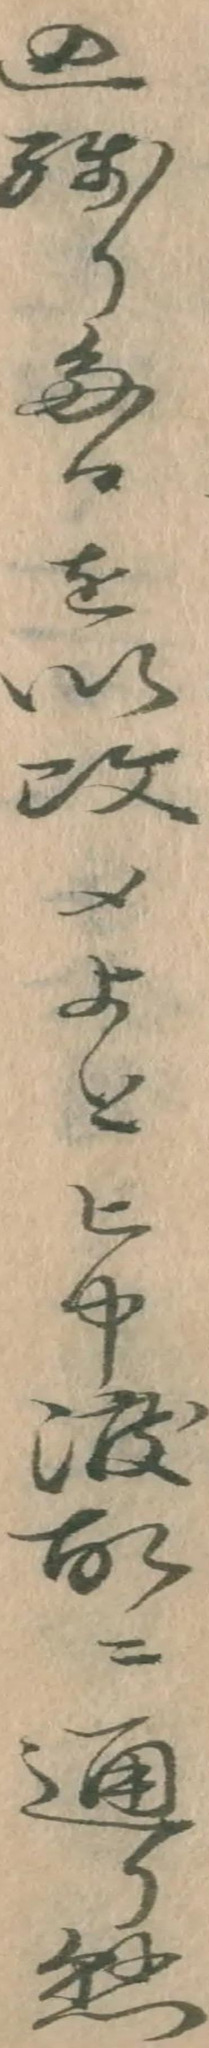込残り多るを以改めよと被申渡故に通り懸
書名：切支丹御退治記 49巻. [7]
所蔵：国立国会図書館 National Diet Library, JAPAN
